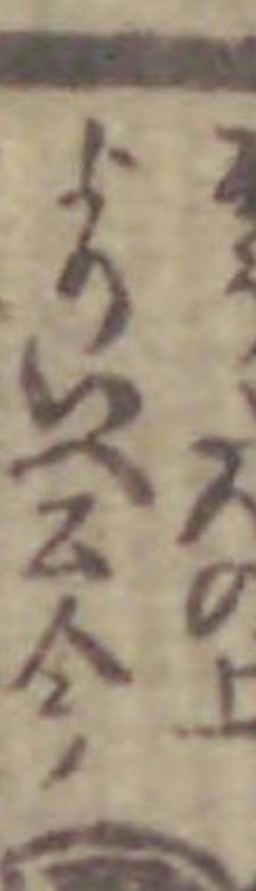よりいへ公今
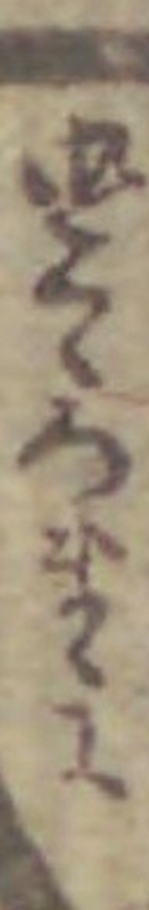御こゝろまゝに
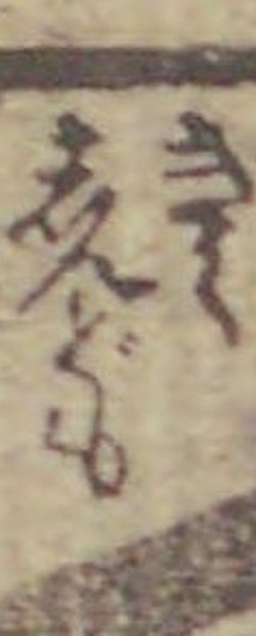しんども
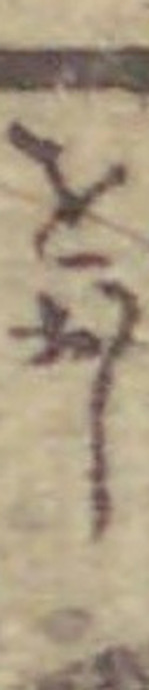をおし
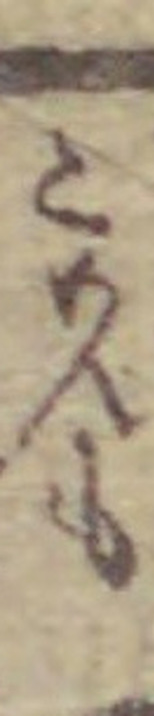とめんも
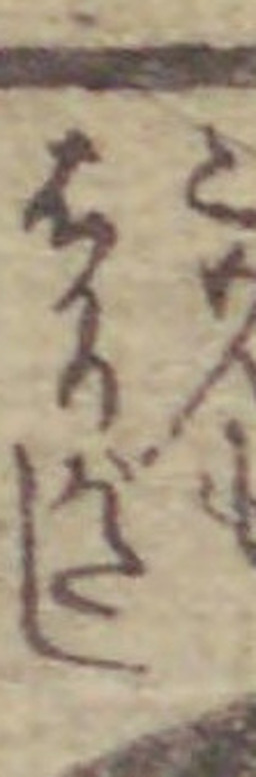はかりがたし
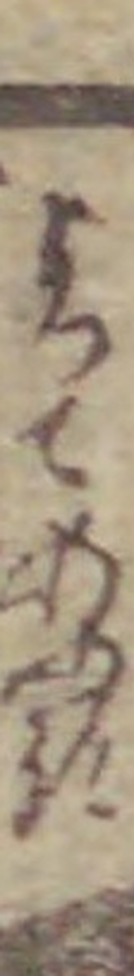よつてあふき
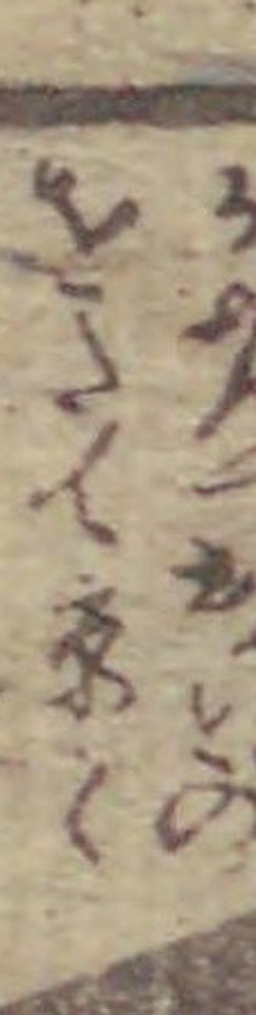をたて京と
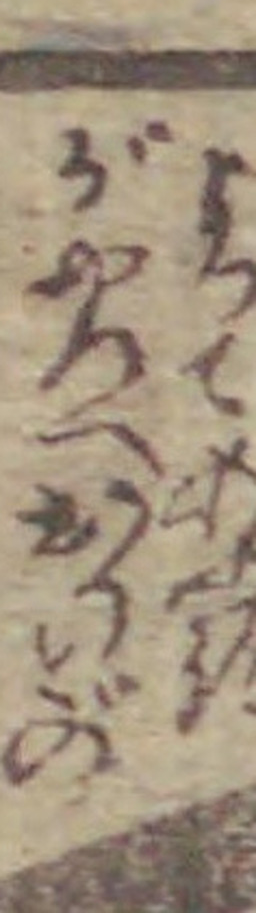がやつへおりどの
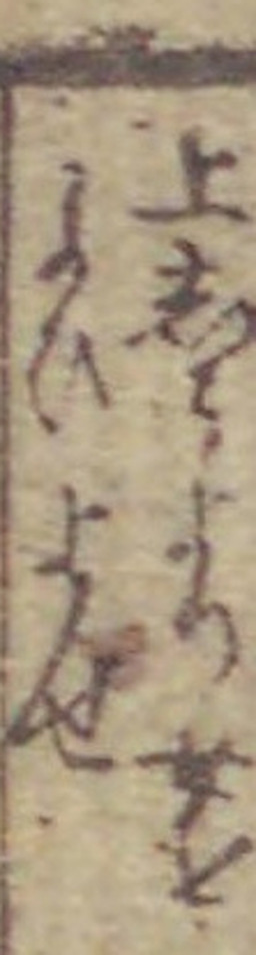よひよせ
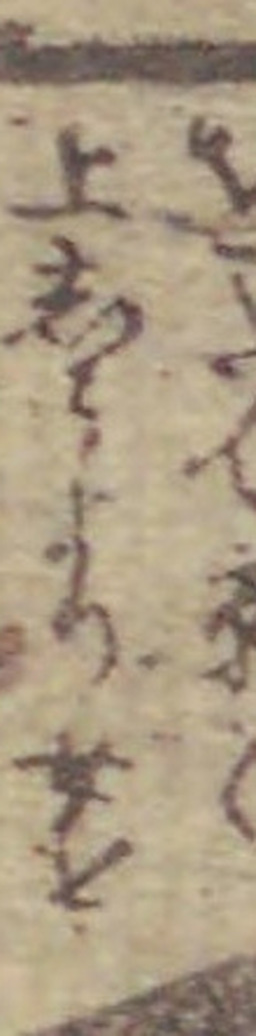上しちより女を

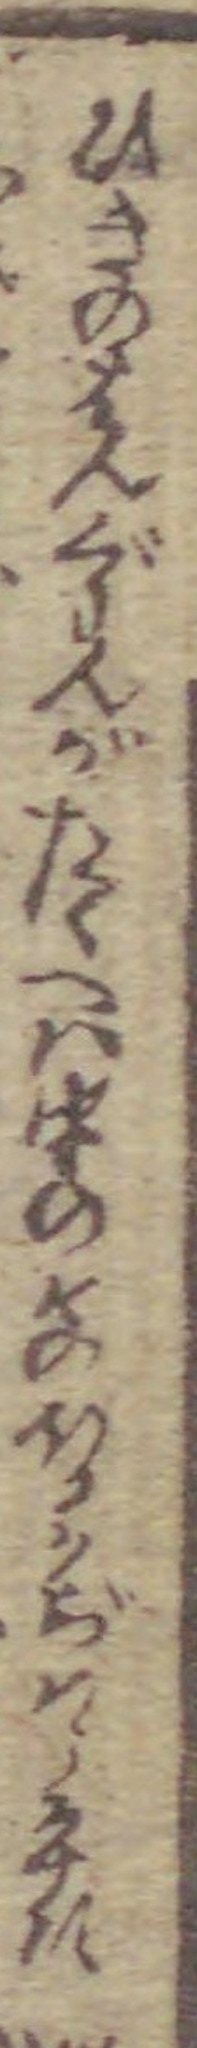ひきのはんぐわんがたくへは中のそのほかかぢはら平次
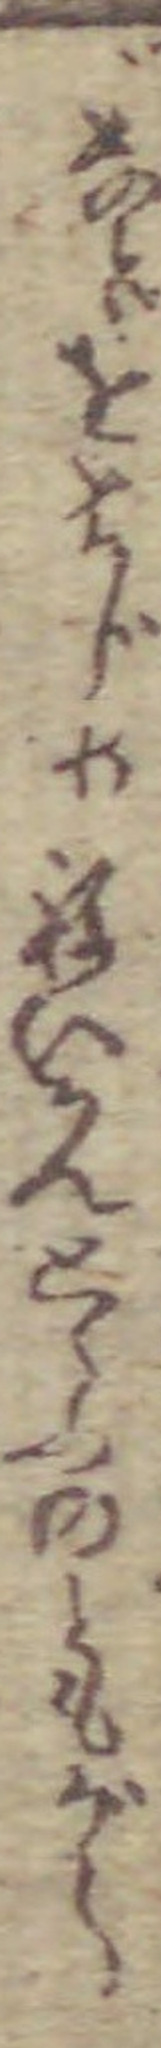などをはじめねいかんとゝふのともがら
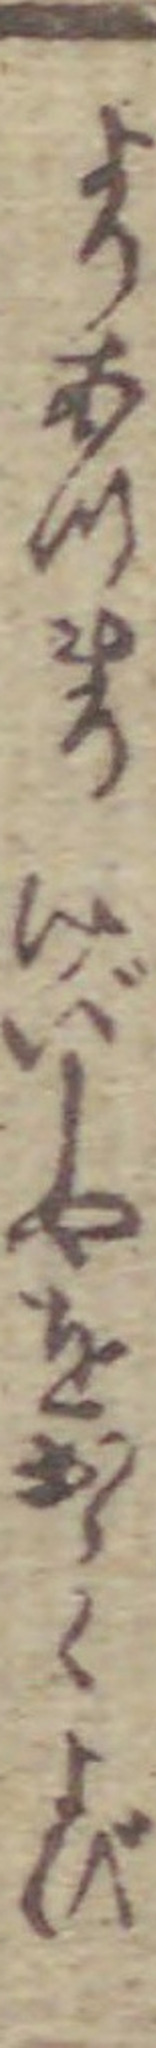よりあつまりげいしやをおゝくよび
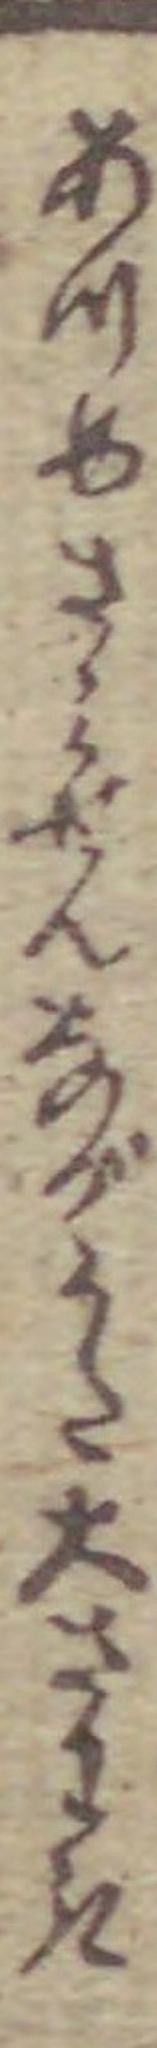あつめさみせんながうた大さわき
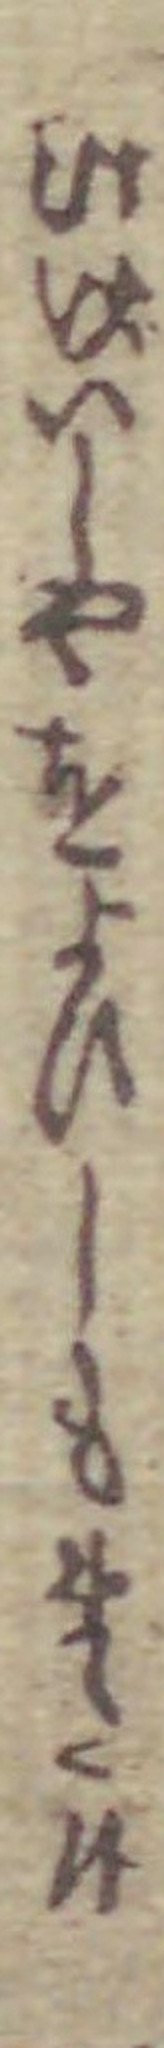此げいしやをよひしもまた候
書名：鎌倉山紅葉浮名
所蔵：国立国会図書館 National Diet Library, JAPAN
